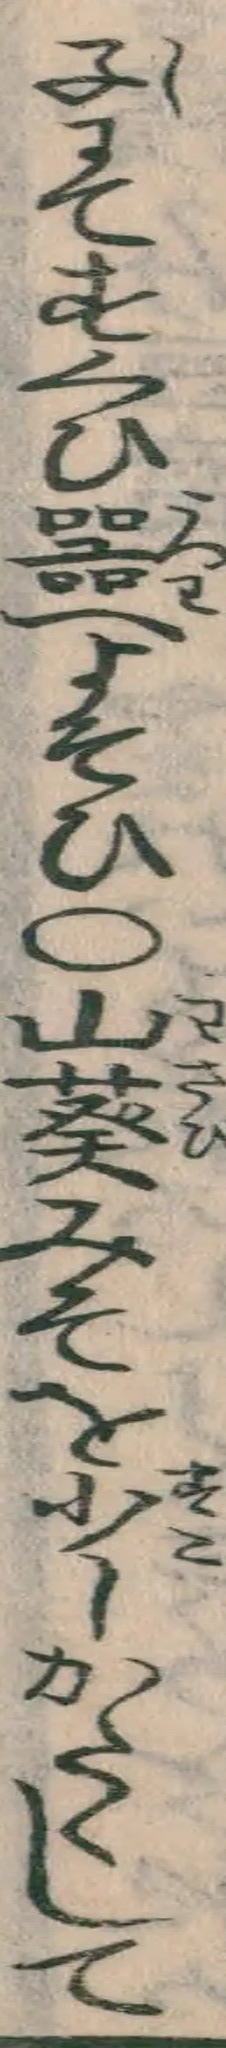子にてすくひ器へよそひ○山葵みそを少しかたくして
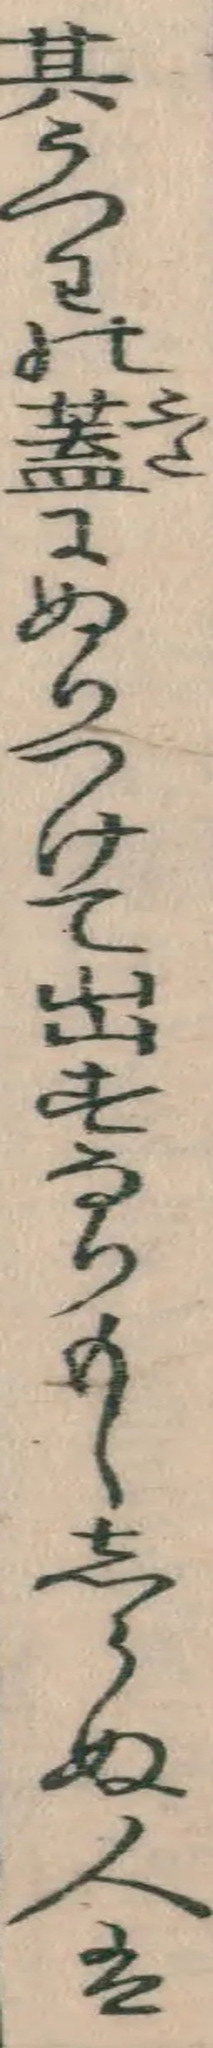其のうつわの蓋にぬりつけて出すなりもししらぬ人は
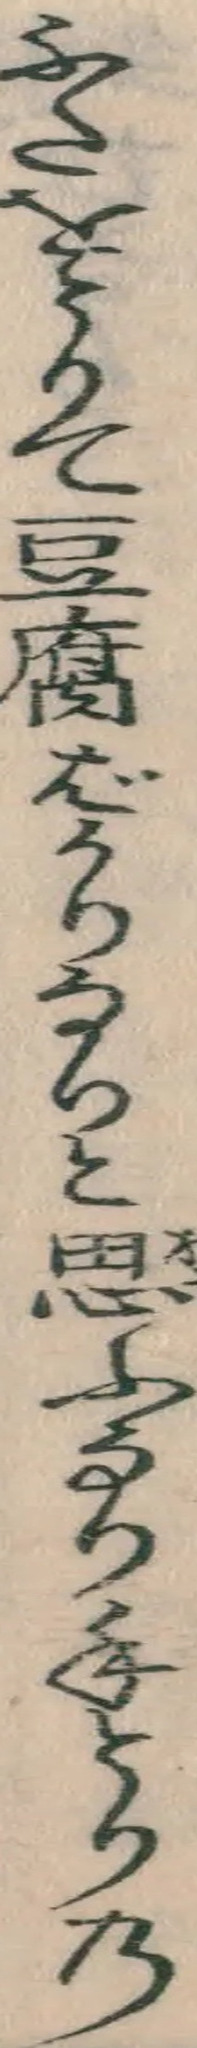ふたをとりて豆腐ばかりなりと思ふなり手とりの
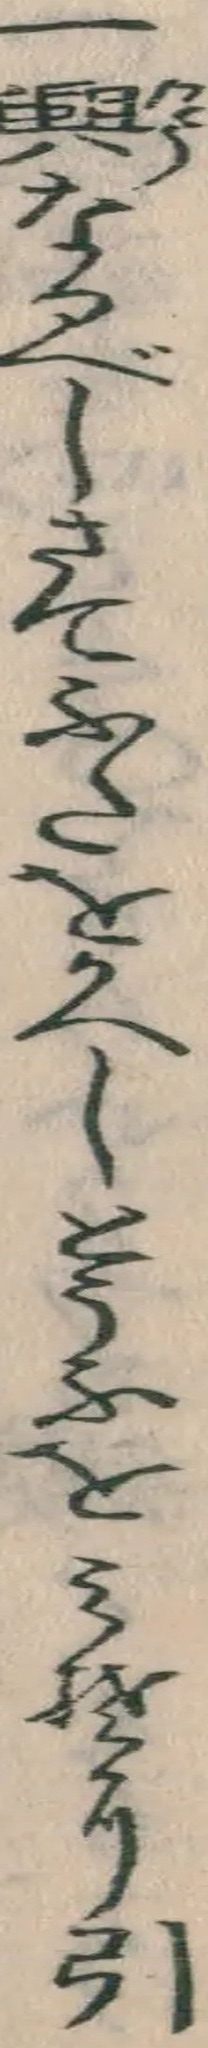一興なるべしさてふたをかへしとうふをみそに引
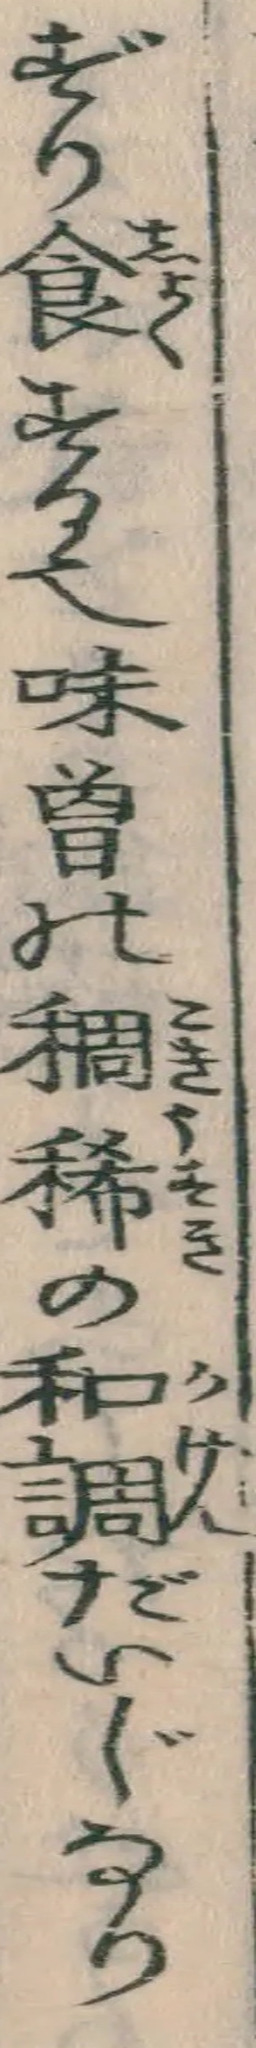ずり食する也味曽の稠稀の和調だいじなり

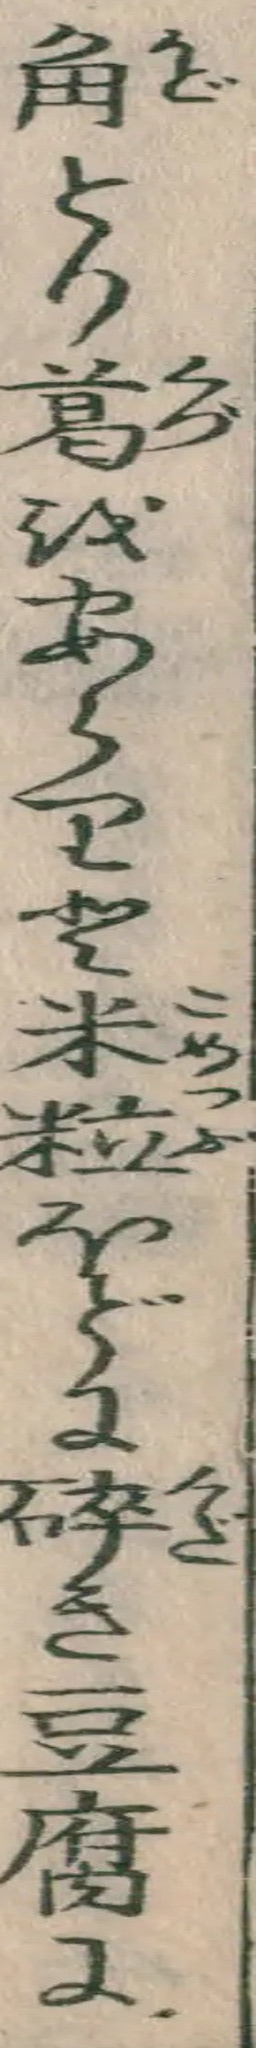角とり葛をあらりと米粒ほどに砕き豆腐に
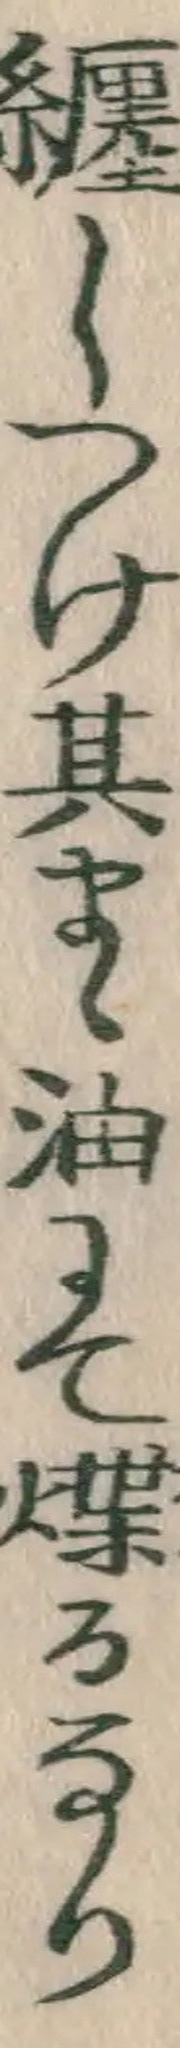纏しつけ其まゝ油にて煠るなり
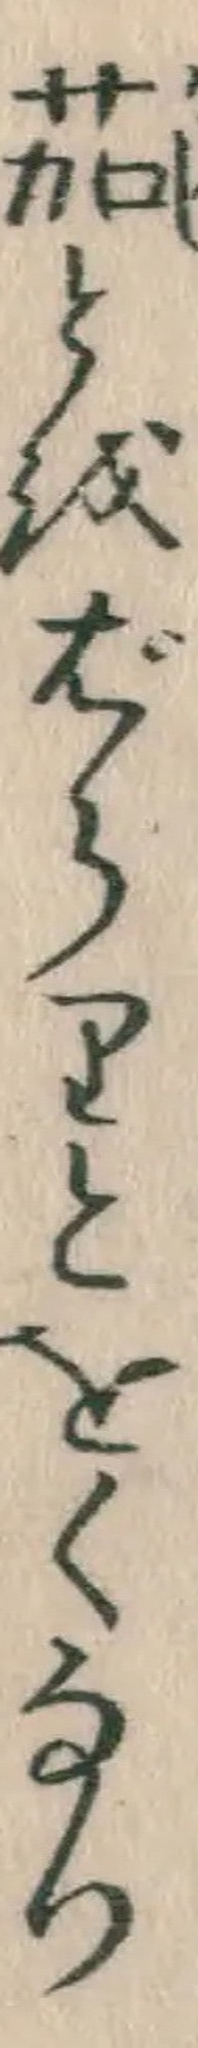茄とをばらりとをくなり
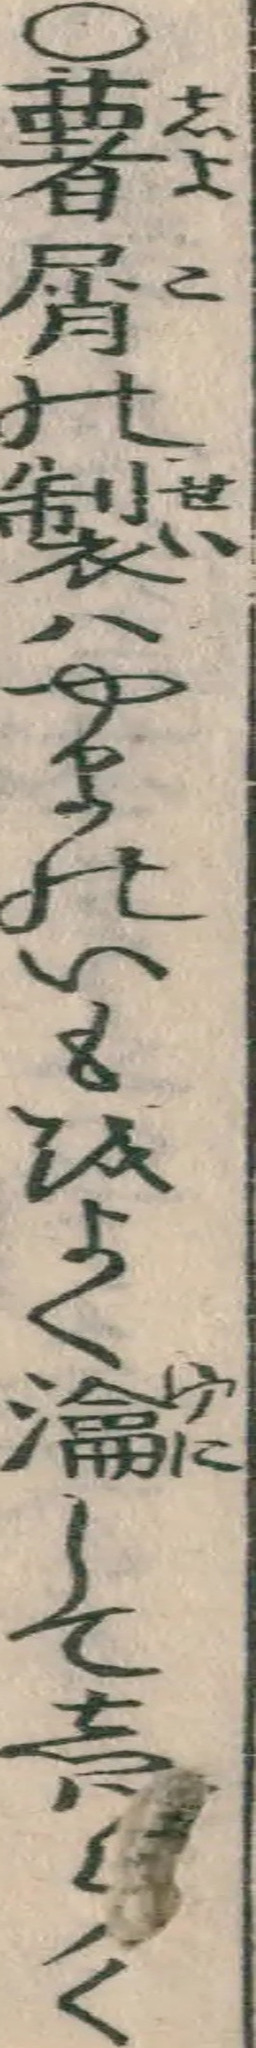○薯屑の製はやまのいもをよく㵸してしはく
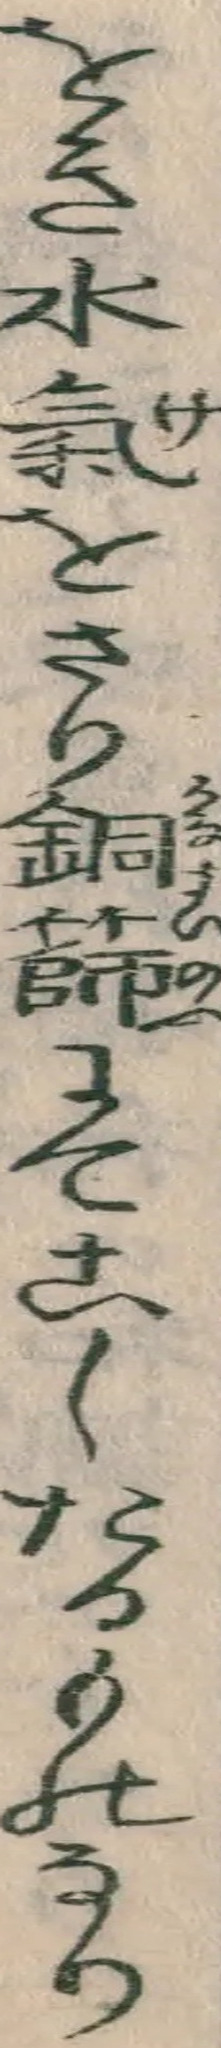をき水気をさり銅篩にてこしたるものなり
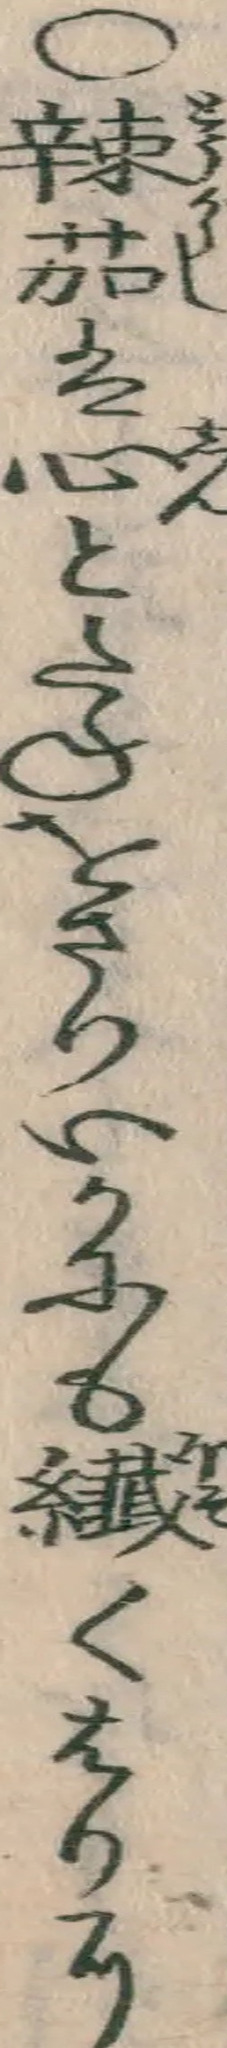○辣茄を心とたねをさりいかにも繊くはりに
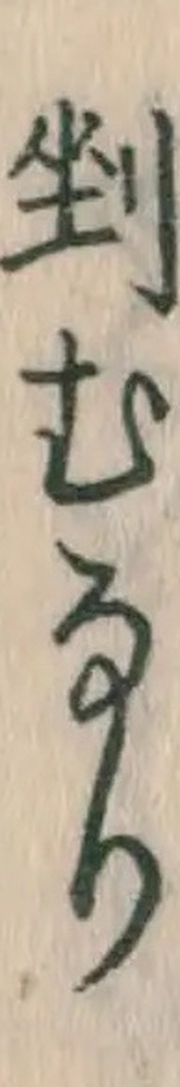剉むなり
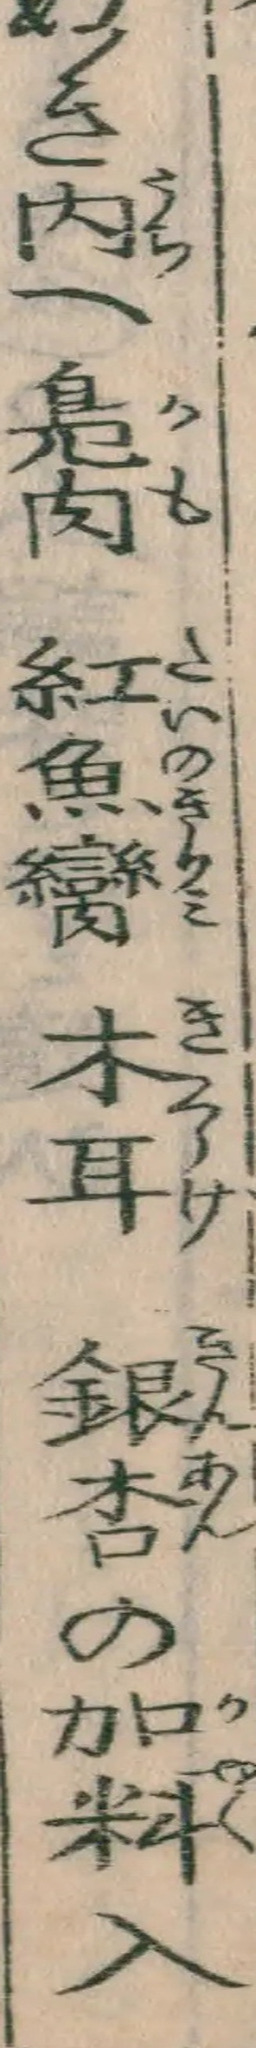ぬき内へ鳧肉紅魚臠木耳銀杏の加料入
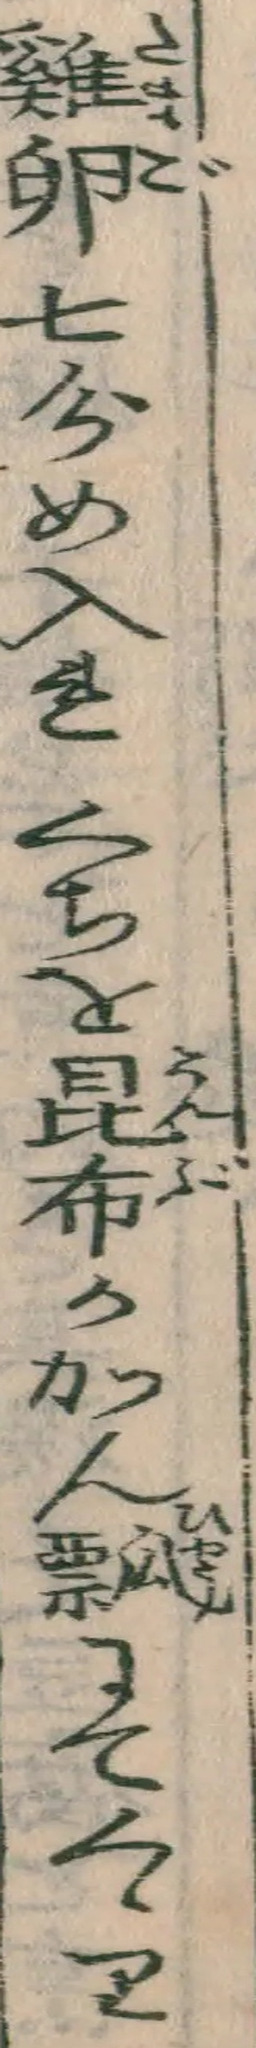雞卵七分め入れくちを昆布かかん瓢にてくゝり
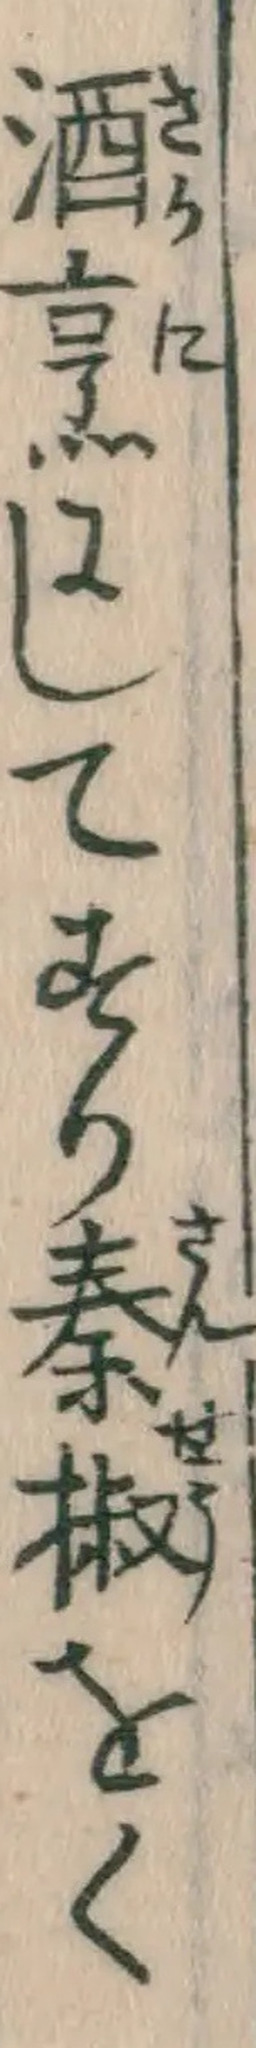酒烹にしてすり秦椒をく
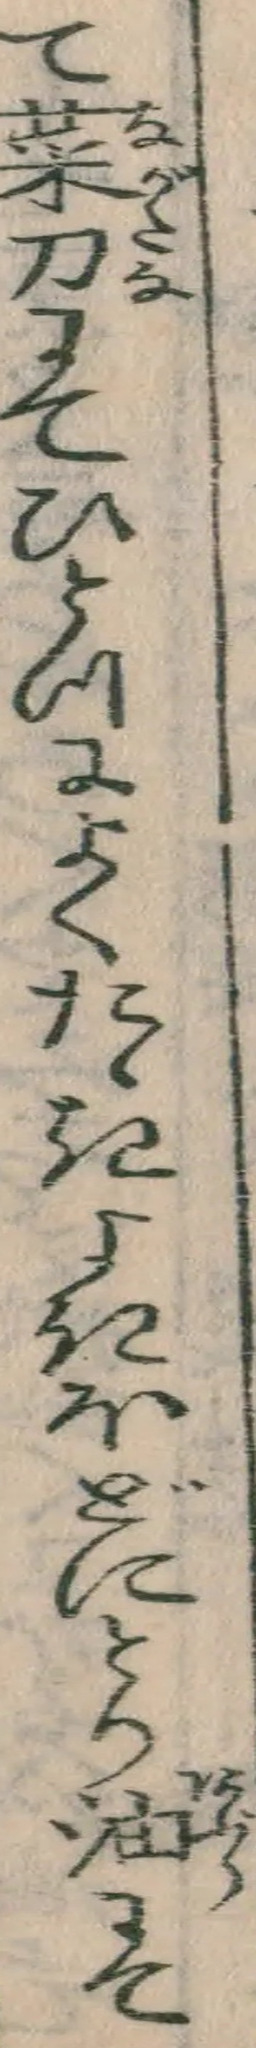て菜刀にてひとつによくたゝきよきほどにとり油にて
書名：豆腐百珍. [正編]
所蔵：国立国会図書館 National Diet Library, JAPAN
